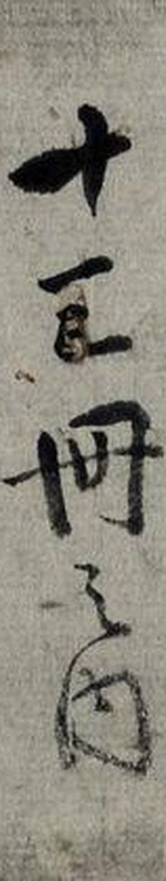十三冊之内

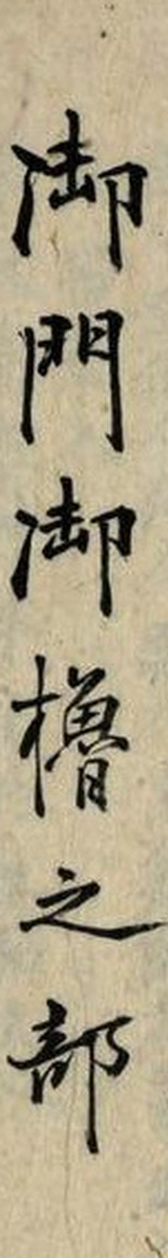御門御櫓之部

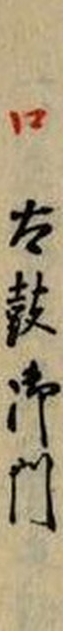ロ太鼓御門
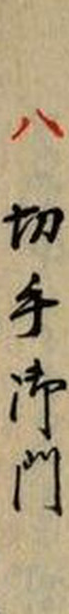ハ切手御門
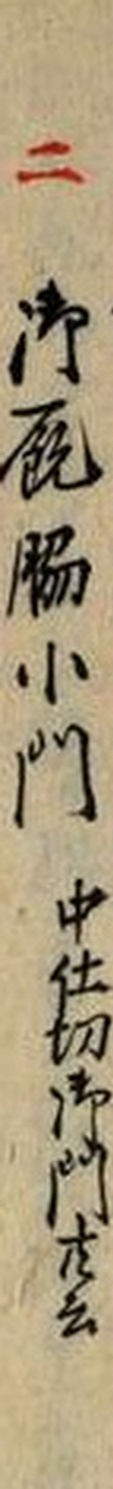ニ御厩脇小門中仕切御門共云
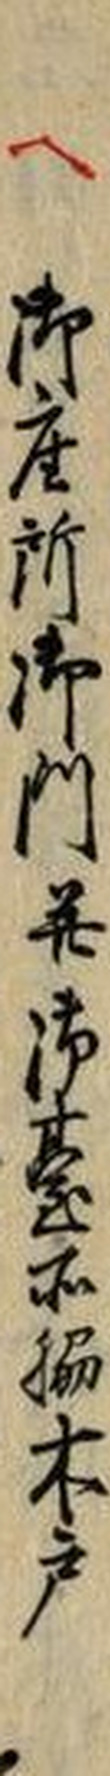ヘ御座所御門并御台所脇木戸
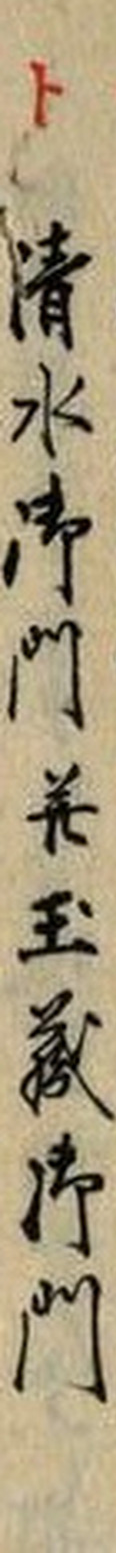ト清水御門并玉蔵御門
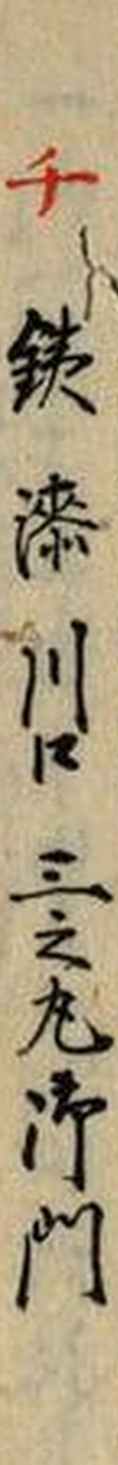チ鉄漆川口三之丸御門
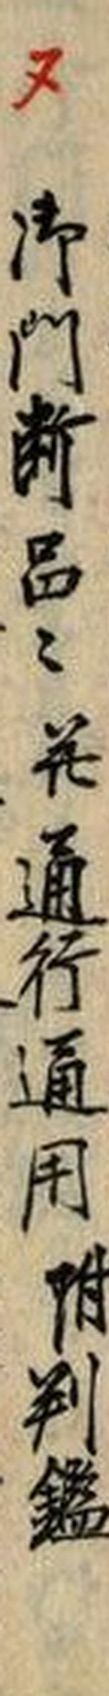ヌ御門断品々并通公通用附判鑑
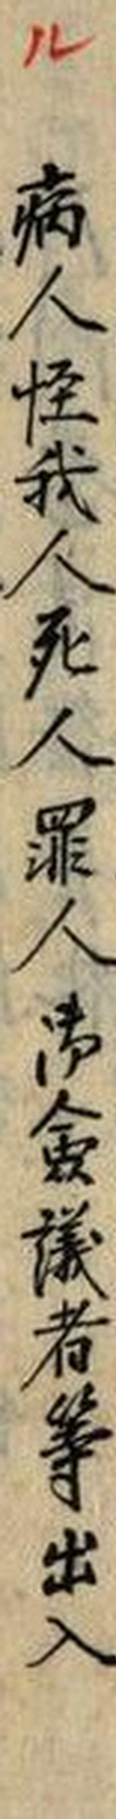ル病人怪我人死人罪人御僉議者等出入
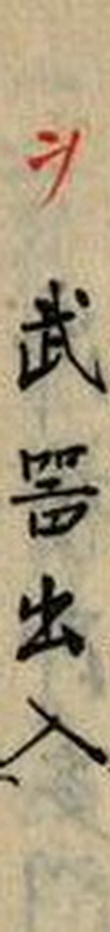ヲ武器出入
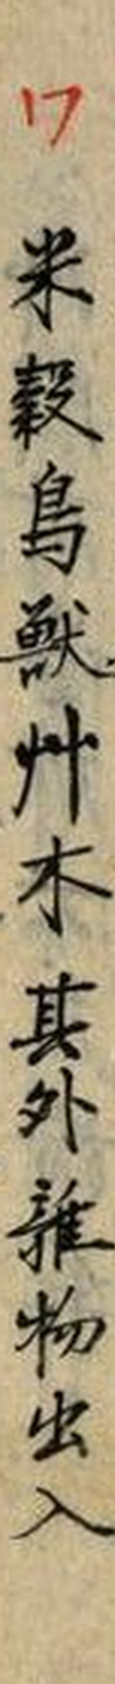ワ米穀鳥銃竹木其外雑物出入
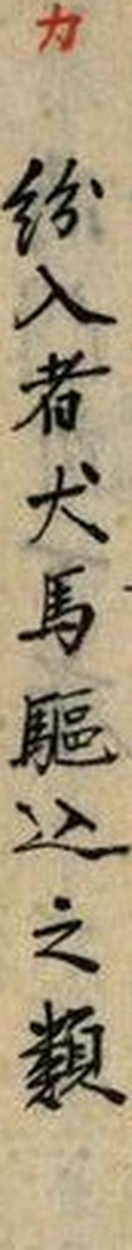カ紛入者犬馬駈込之類

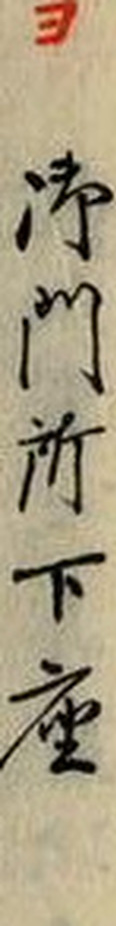ヨ御門所下座
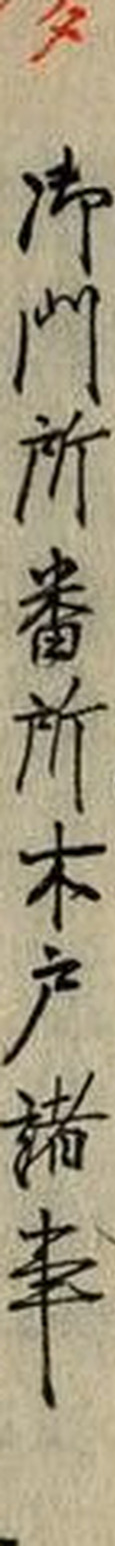タ御門所番所木戸諸事
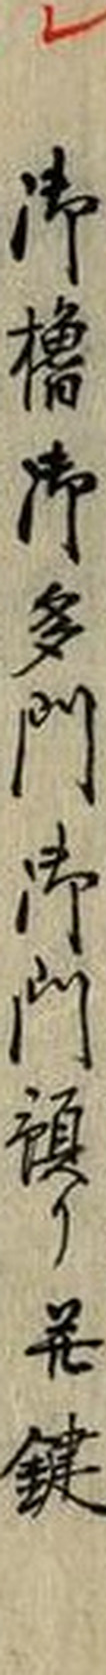レ御櫓御多門御門預り并鍵
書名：御門御櫓之部
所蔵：福井県文書館 Fukui Prefectural Archives
